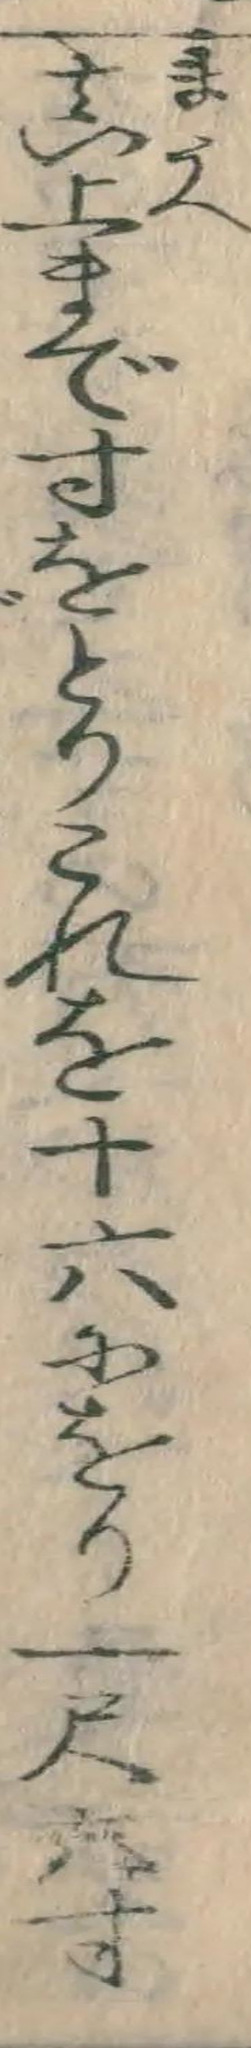真上まで寸をとりこれを十六にをり一尺六寸
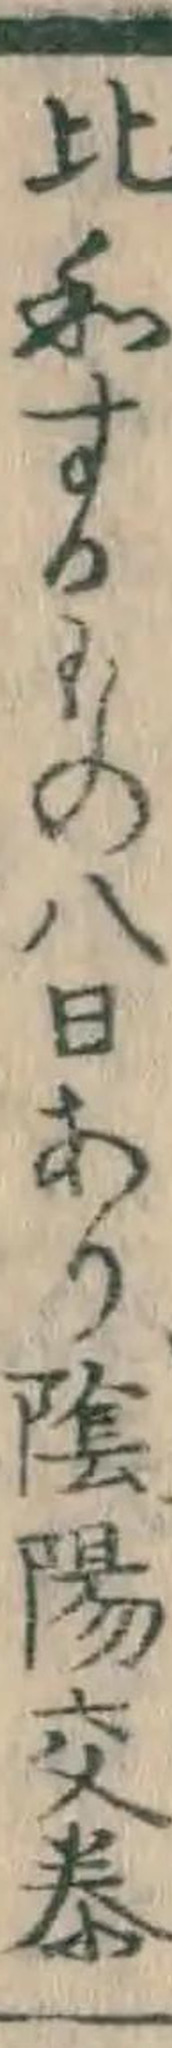比和するもの八日あり陰陽交泰
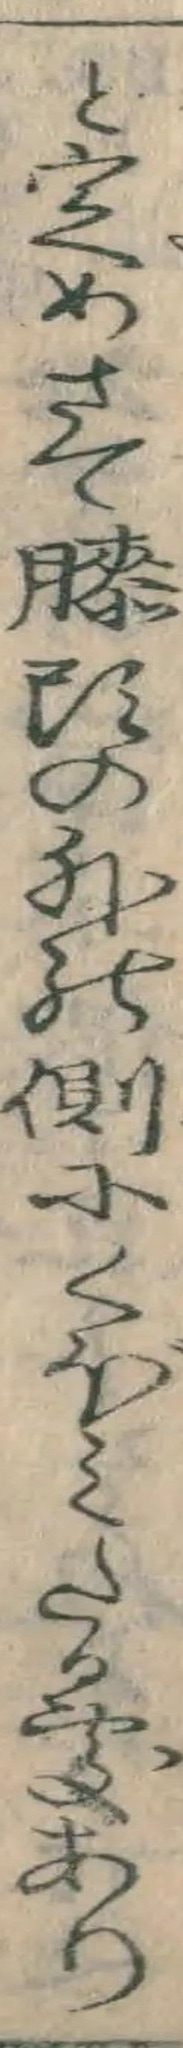と定めさて膝頭の外の側にくぼみたる処あり

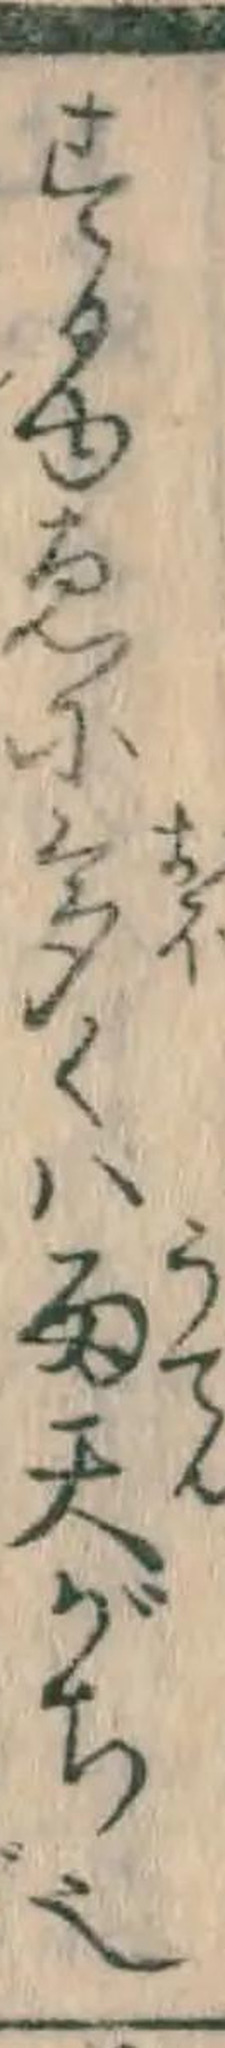するゆゑに多くは雨天がち也
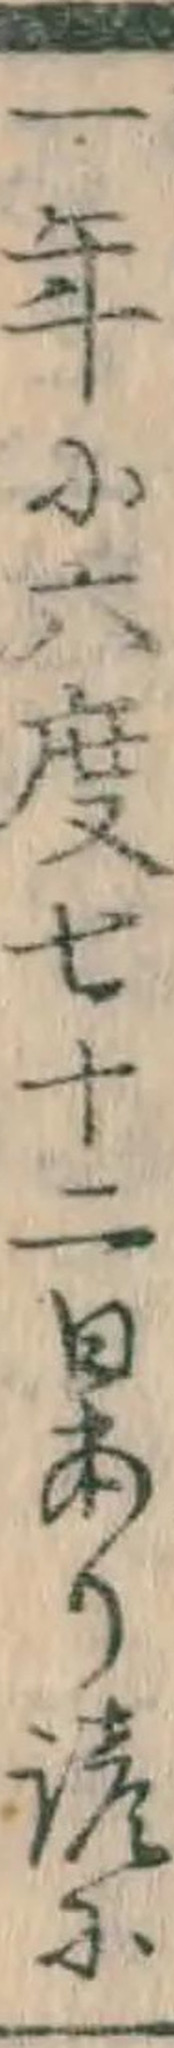一年に六度七十二日あり諺に
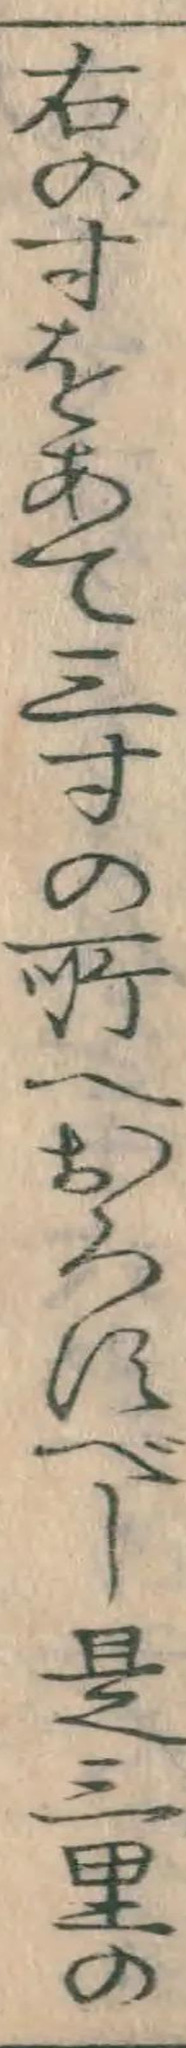右の寸をあて三寸の所へおろすべし是三里の
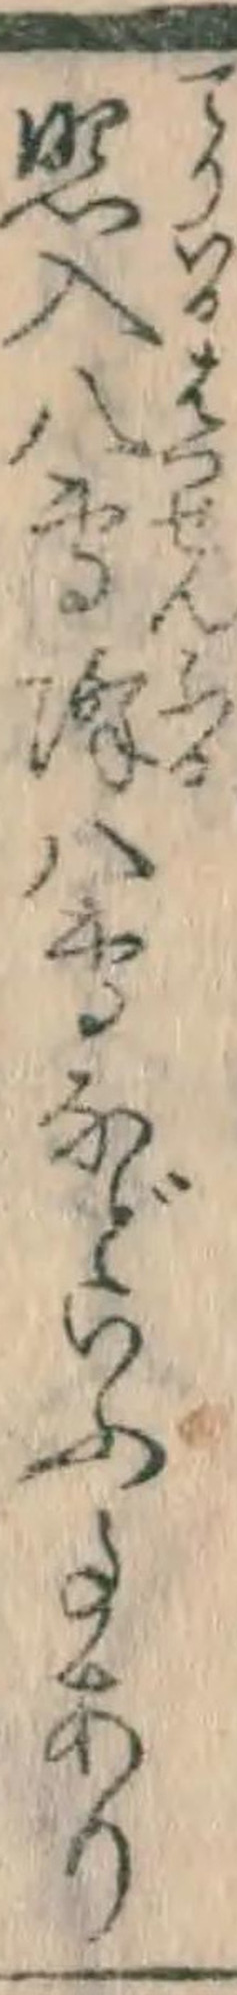照入八専降八専などいふ事あり
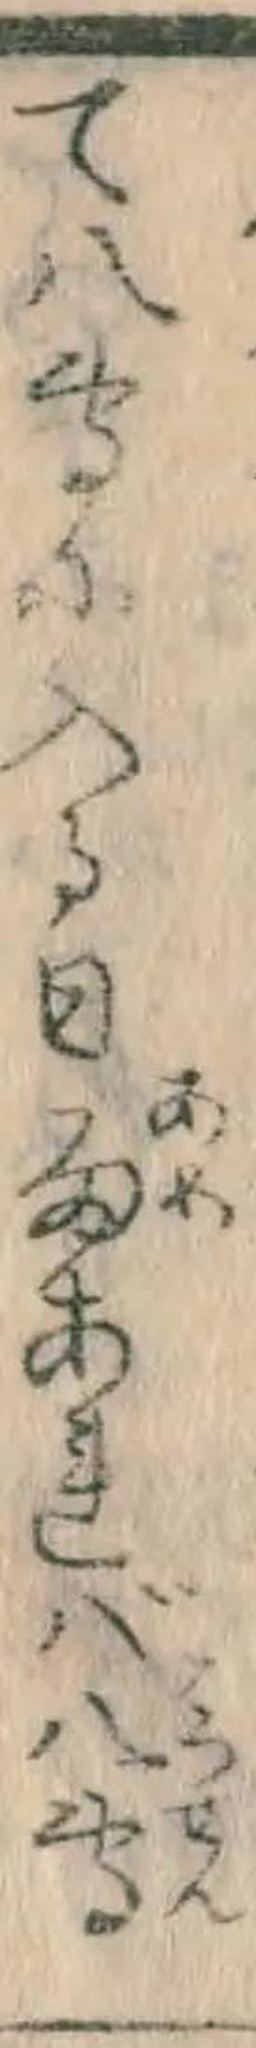て八専に入る日雨あれば八専
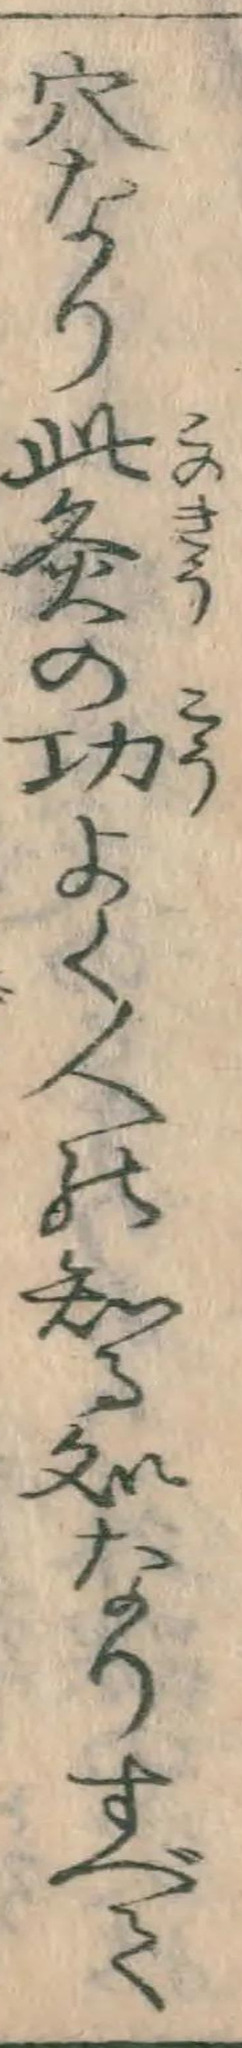穴なり此灸の功よく人の知る処なりすべて
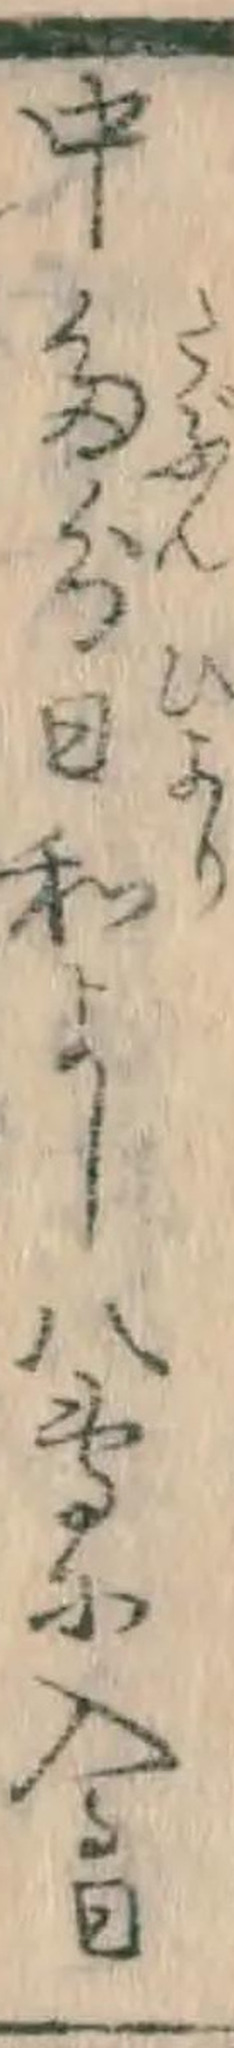中多分日和よし八専に入る日
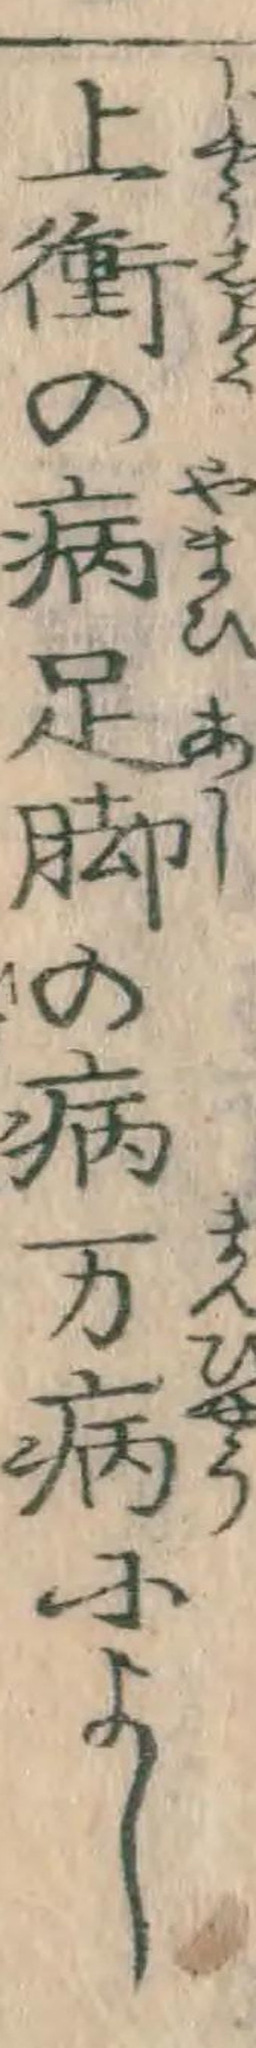上衝の病足脚の病万病によし
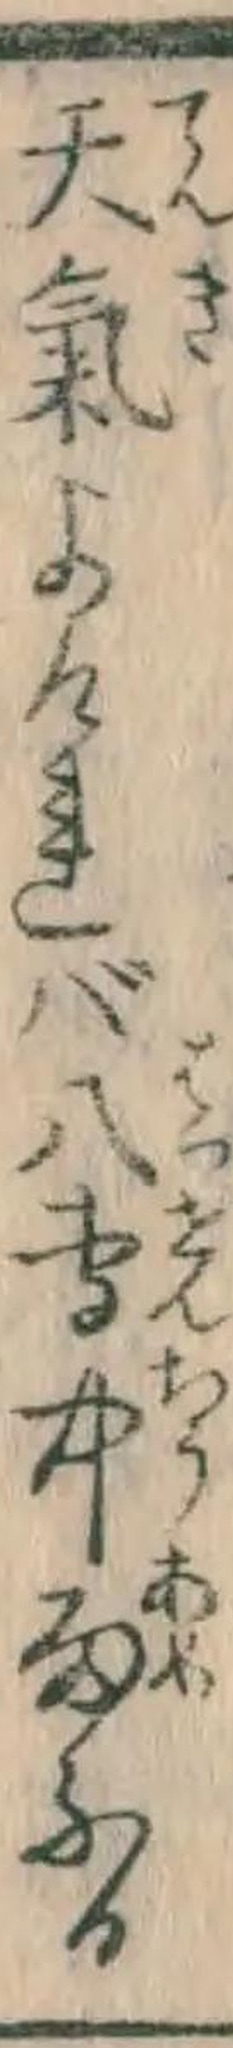天気よければ八専中雨ふる
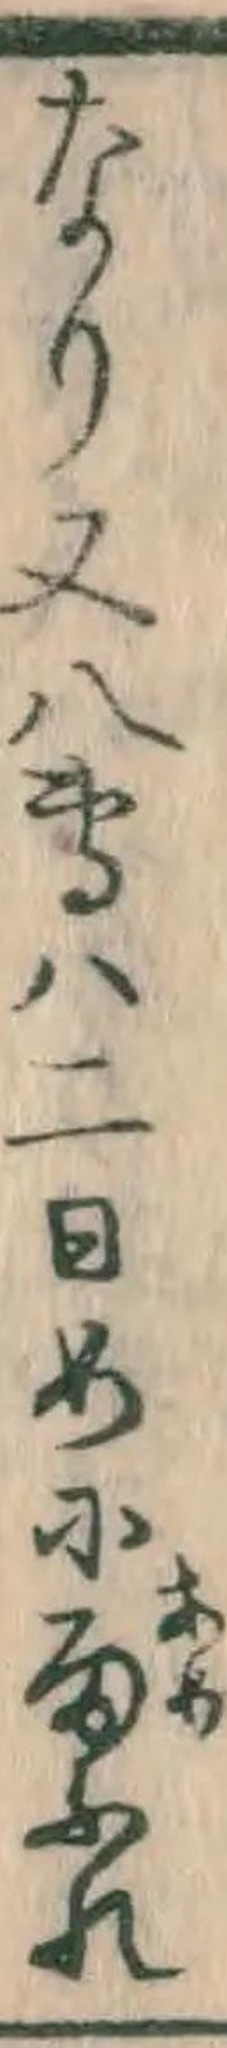なり又八専は二日めに雨ふれ
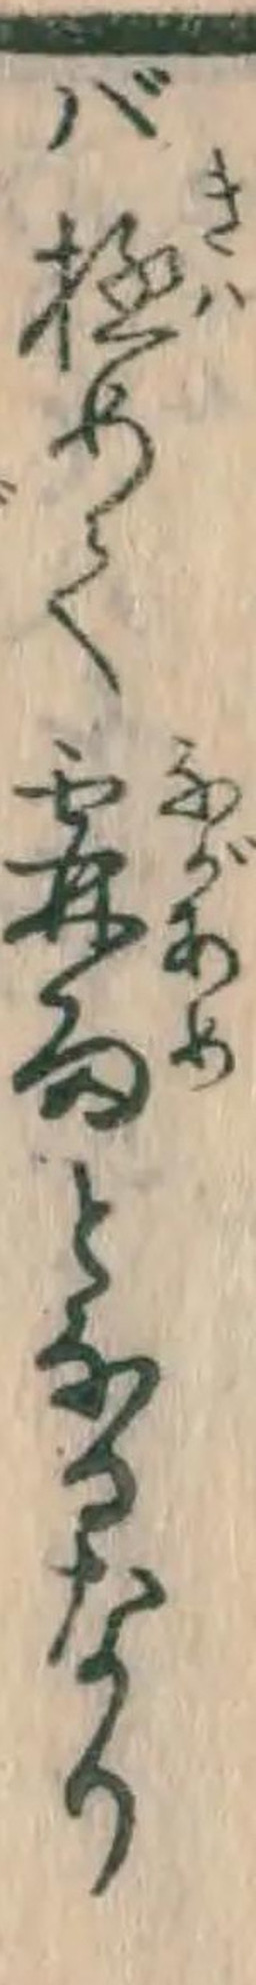ば極めて霖雨となるなり
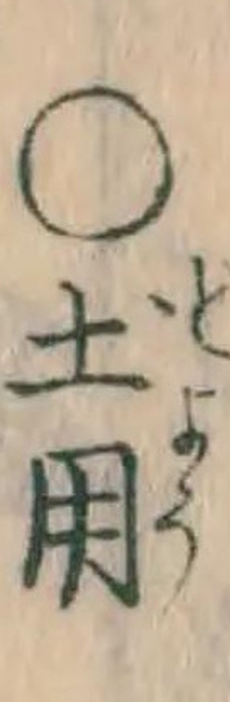○土用
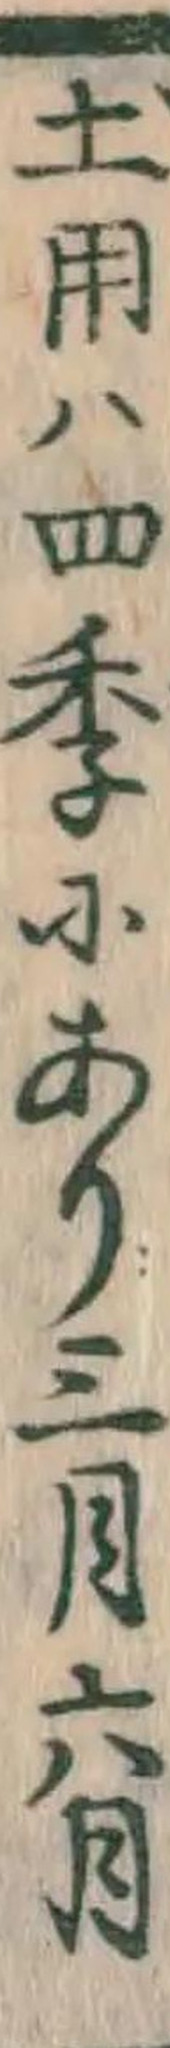土用は四季にあり三月六月
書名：広益秘事大全 3巻. [4]
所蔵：国立国会図書館 National Diet Library, JAPAN
